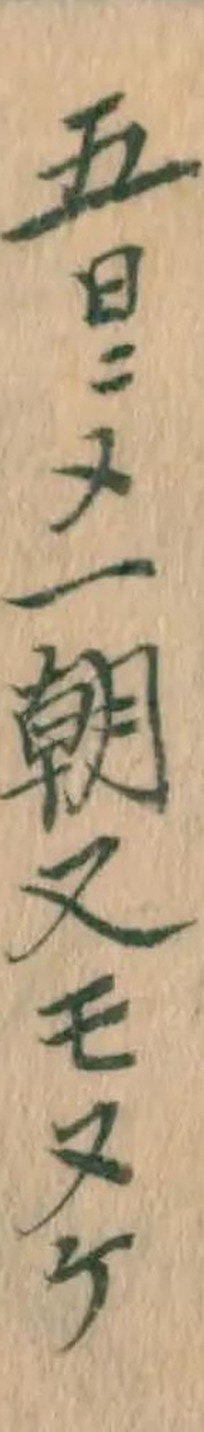五日ニシテ一朝又モヌケ
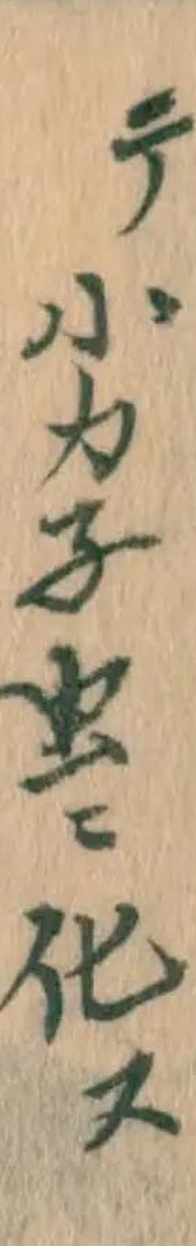テ小カネ虫ニ化ス
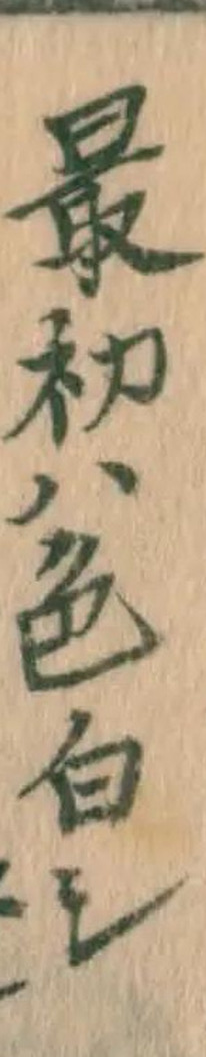最初ハ色白シ
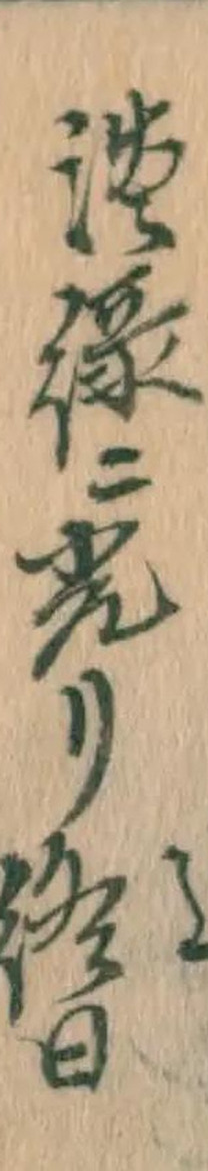淡緑ニ光リ終日
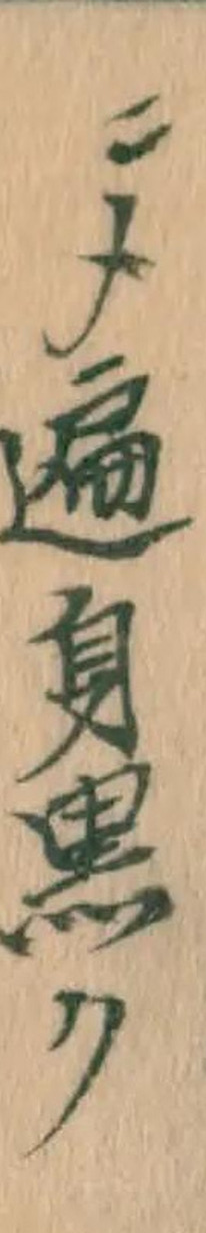ニシテ遍身黒ク
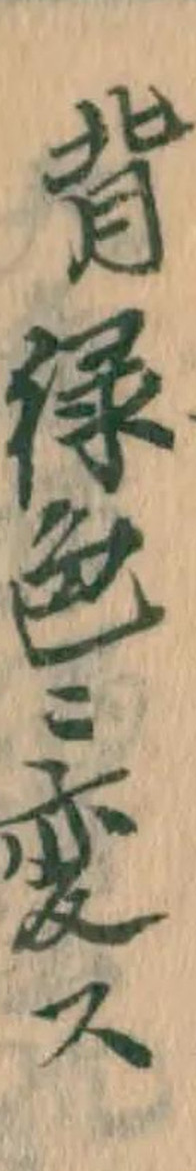背緑色ニ変ス
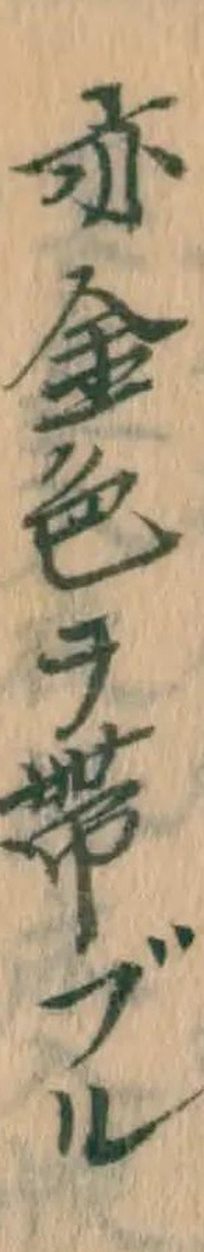亦金色ヲ帯ブル
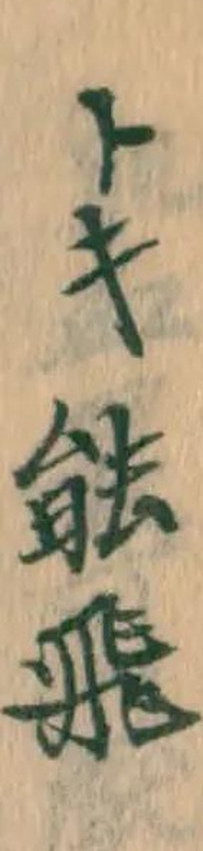トキ能飛
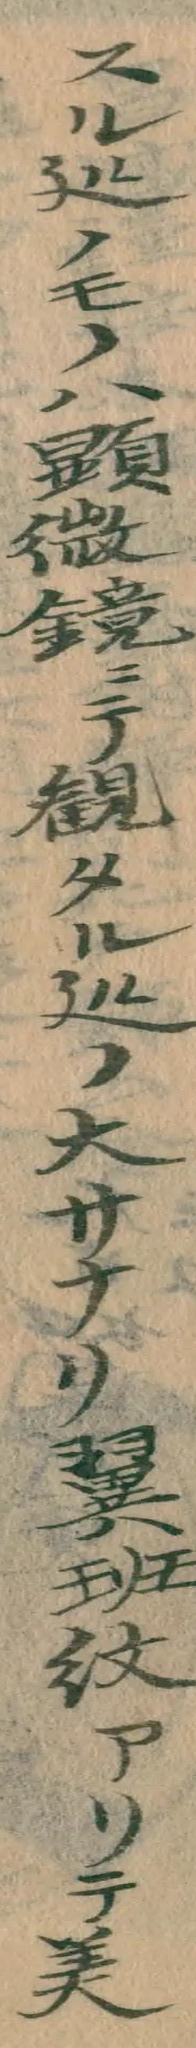スル処ノモノハ顕微鏡ニテ観タル処ノ大サナリ翼班紋アリテ美
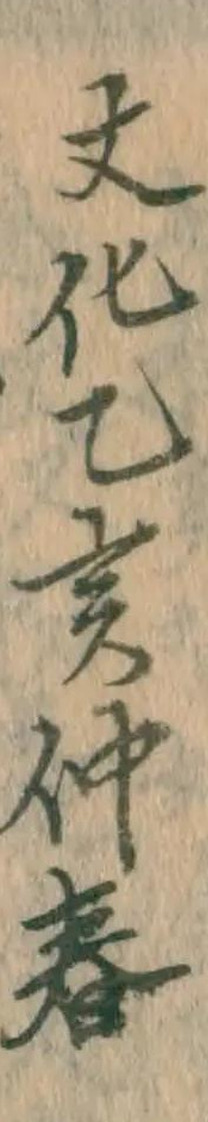文化乙亥仲春
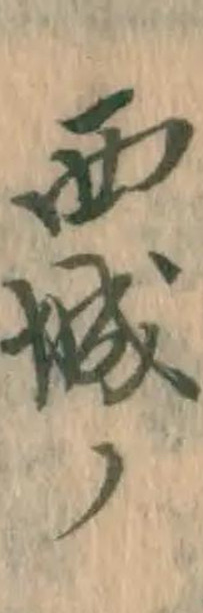西城ノ
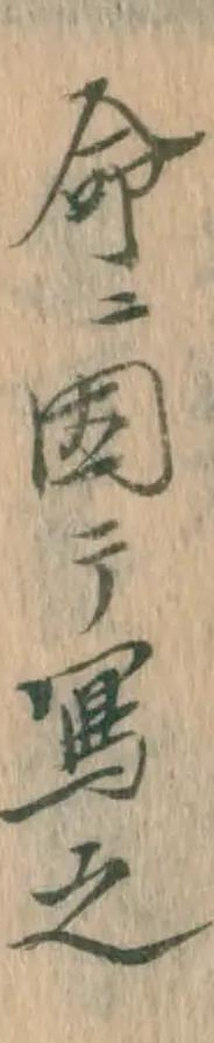命ニ因テ冩之

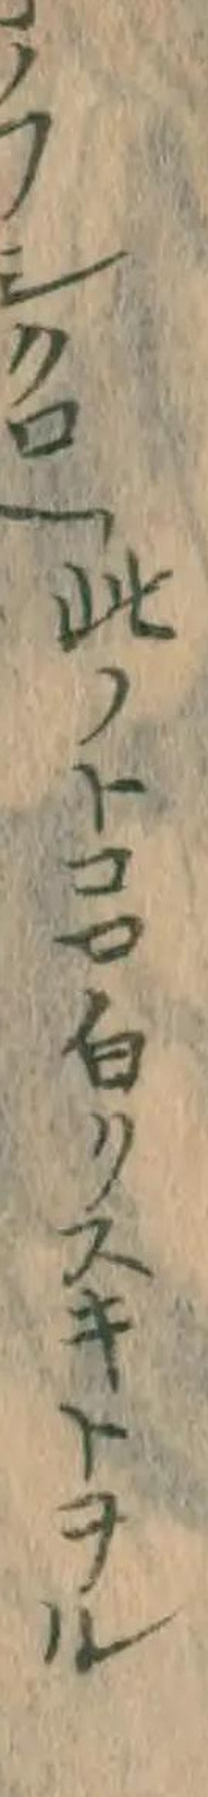手ノフシクロ此ノトコロ白クスキトヲル
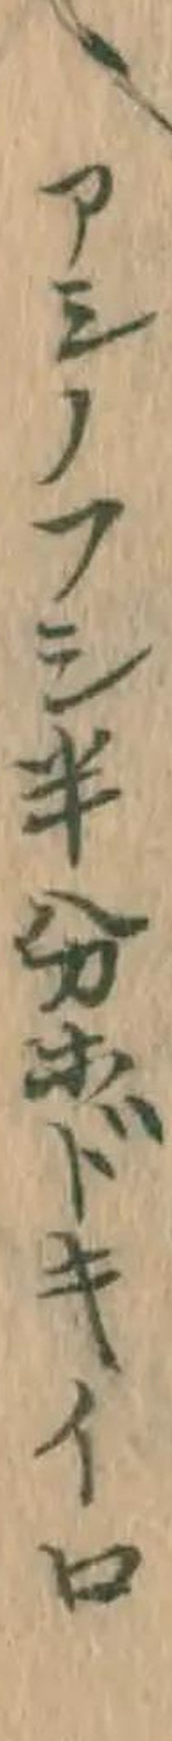アシノフシ半分ホドキイロ
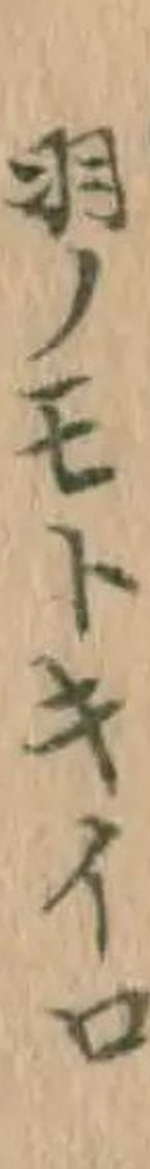羽ノモトキイロ
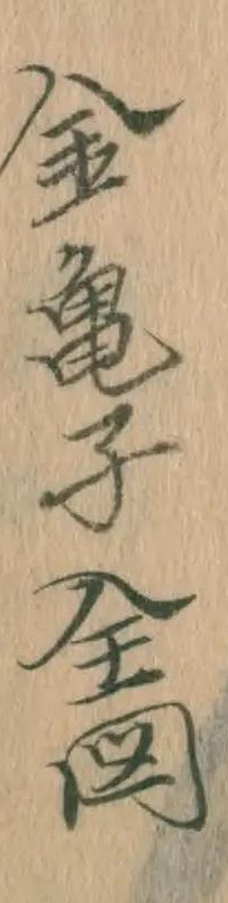金亀子全図
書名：千蟲譜 3巻. [1]
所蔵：国立国会図書館 National Diet Library, JAPAN
